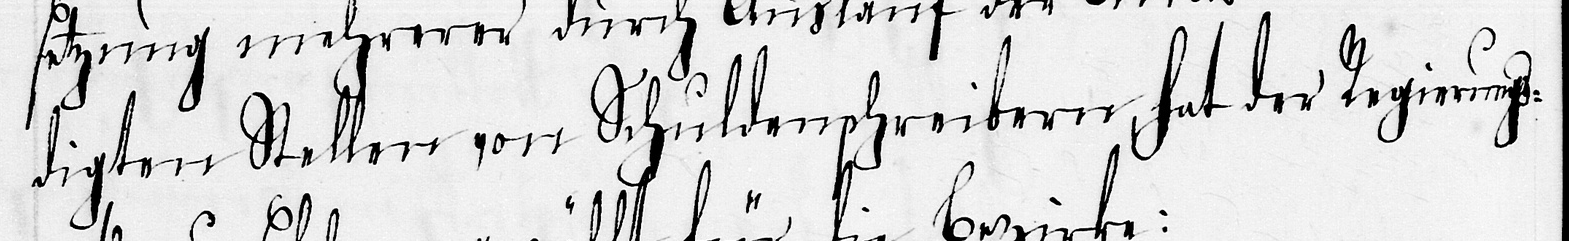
digten Stellen von Schuldenschreibern, hat der Regierung¬
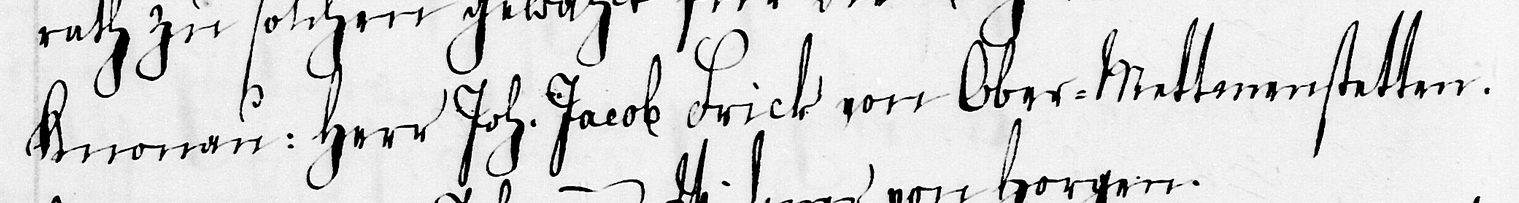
Knonau: Herr Joh. Jacob Frick von Ober-Mettmenstetten.
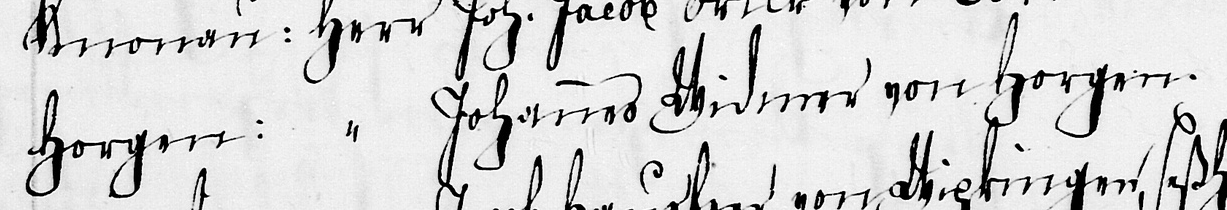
Horgen: “ Johannes Widmer von Horgen.
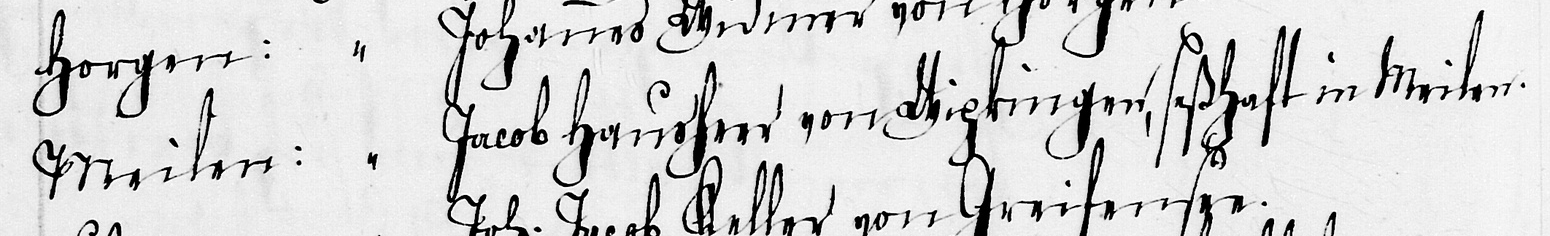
Meilen: “ Jacob Hausheer von Wipkingen, seßhaft in Meilen.
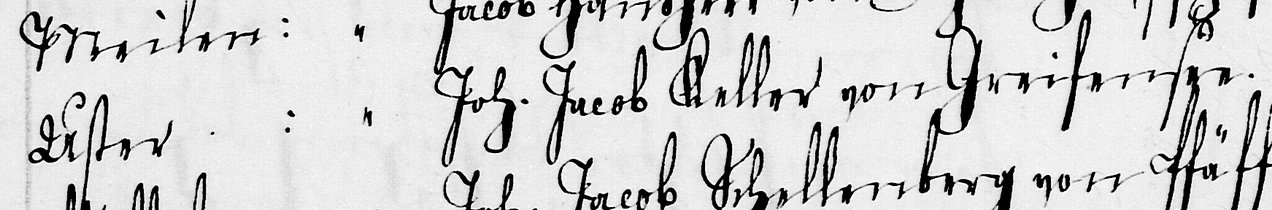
Uster: “ Joh. Jacob Keller von Greifensee.
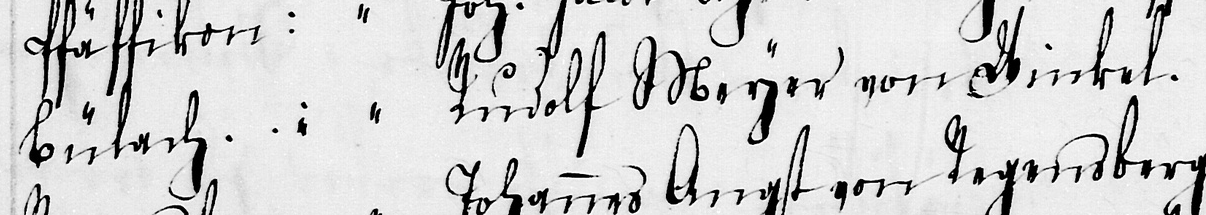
Bülach: “ Rudolf Meyer von Winkel
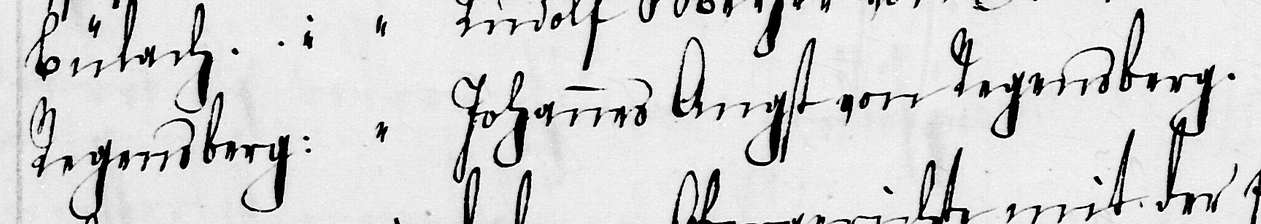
Regensberg: “ Johannes Angst von Regensberg.
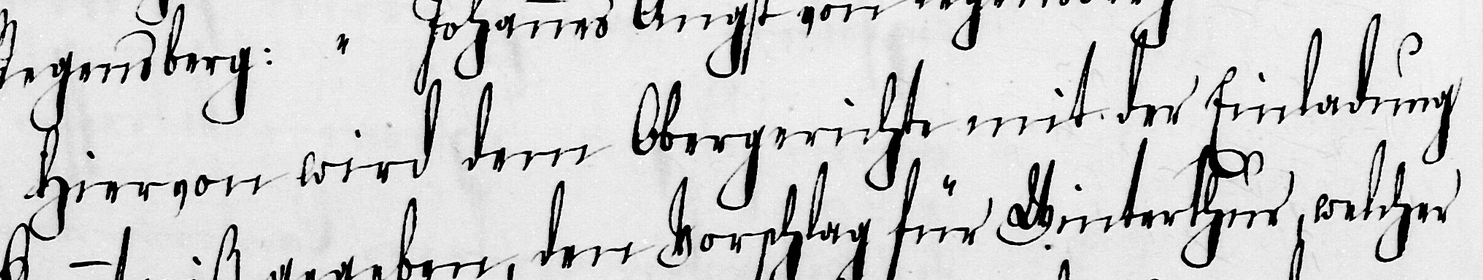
Hiervon wird dem Obergerichte mit der Einladung
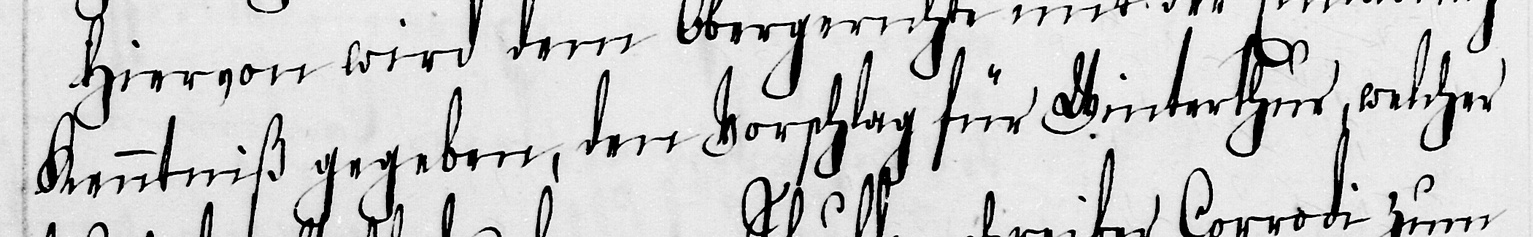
Kenntniß gegeben, den Vorschlag für Winterthur, welcher
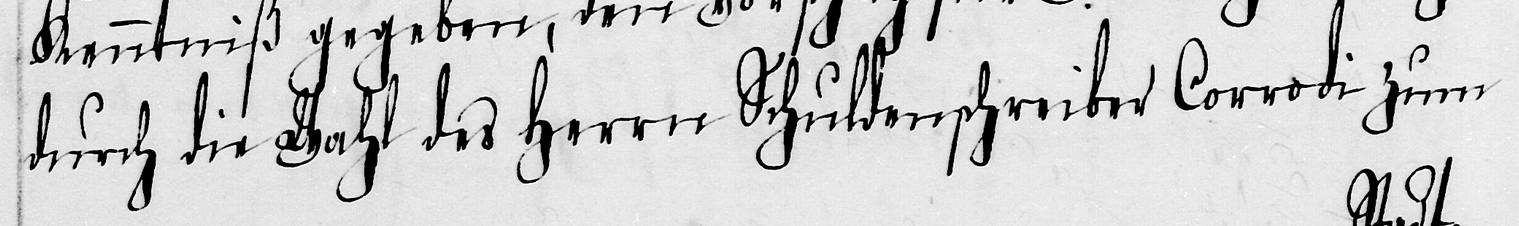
durch die Wahl des Herrn Schuldenschreiber Corrodi zum
